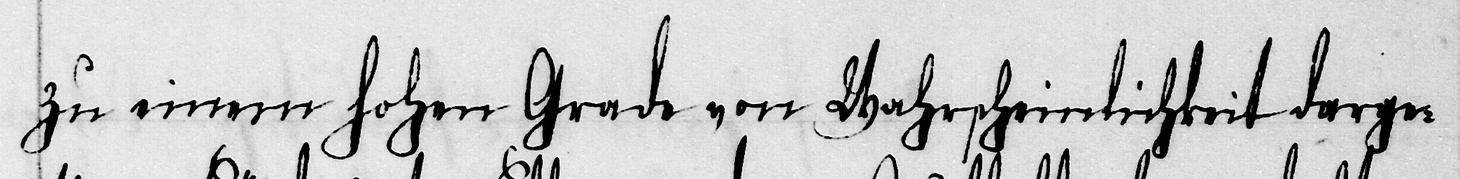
zu einem hohen Grade von Wahrscheinlichkeit darge¬
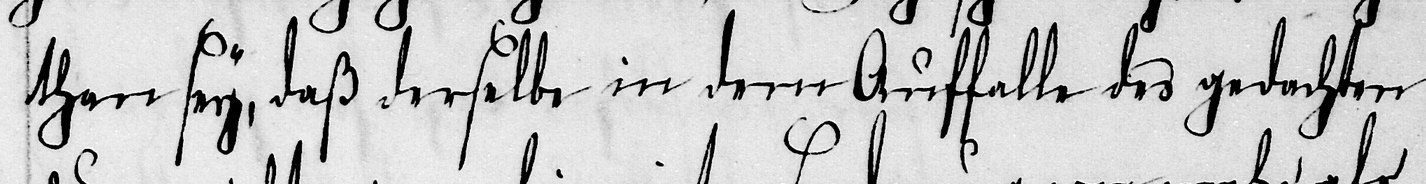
than sey, daß derselbe in dem Auffalle des gedachten
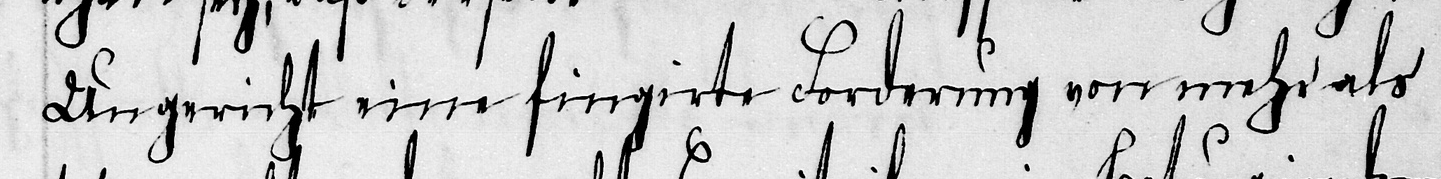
Ungericht eine fingirte Forderung von mehr als
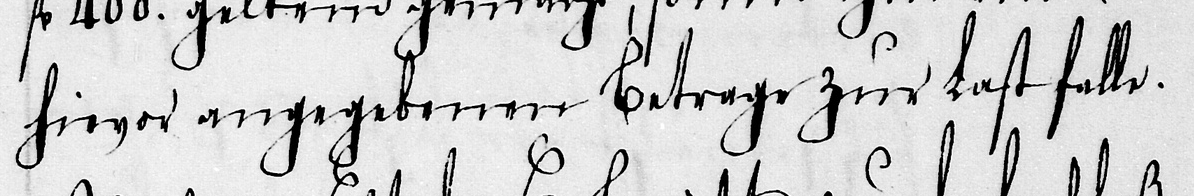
hievor angegebenen Betrage zur Last falle.
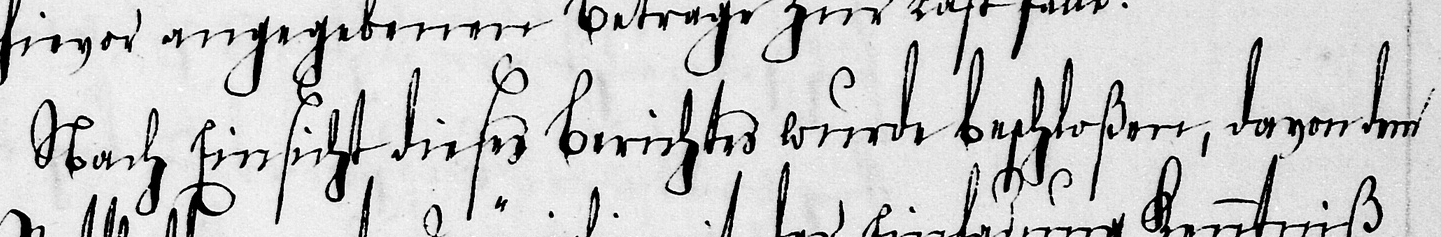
Nach Einsicht dieses Berichtes wurde beschloßen, davon dem
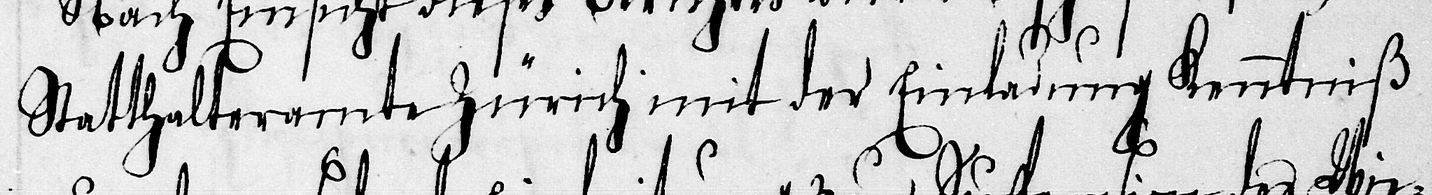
Statthalteramte Zürich mit der Einladung Kenntniß
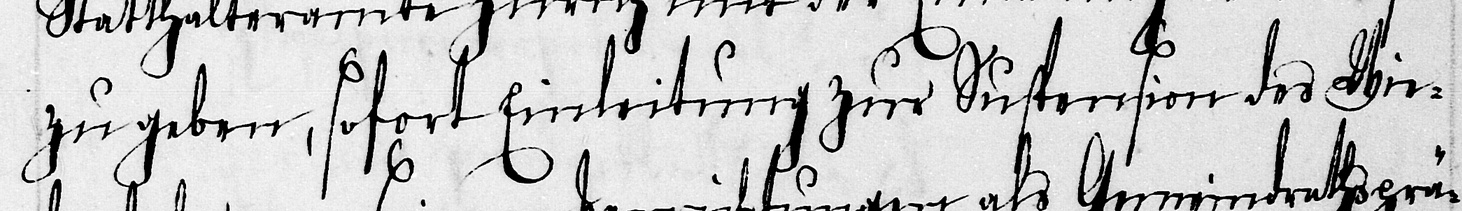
zu geben, sofort Einleitung zur Suspension des Wie¬
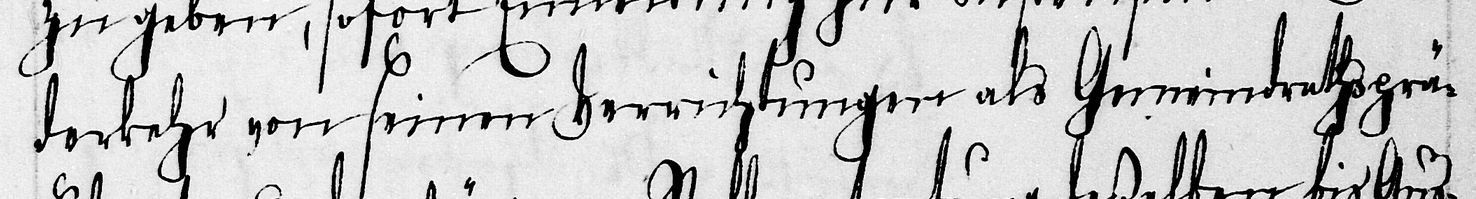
derkehr von seinen Verrichtungen als Gemeindrathsprä¬
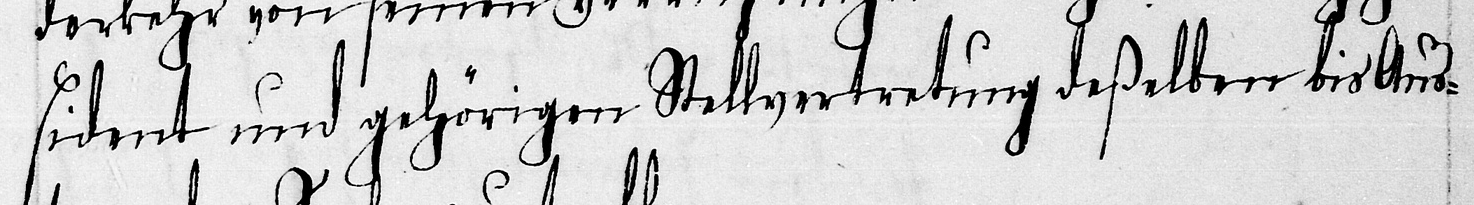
sident und gehörigen Stellvertretung deßelben bis Aus¬
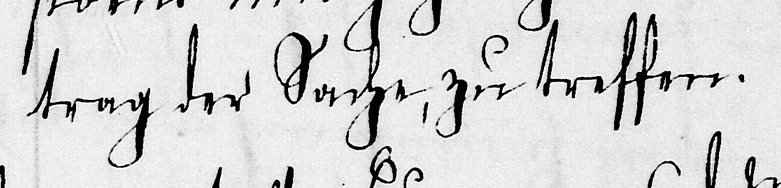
trag der Sache, zu treffen.
